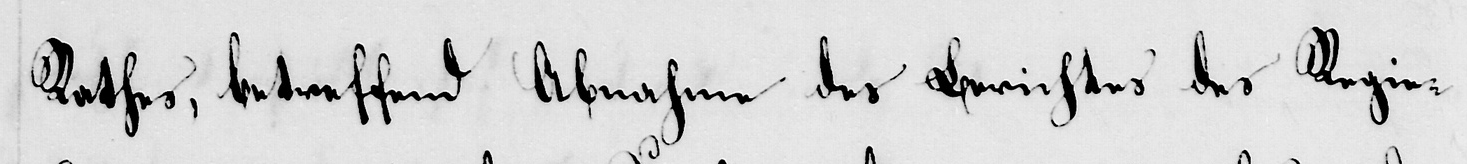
Rathes, betreffend Abnahme des Berichtes des Regie¬
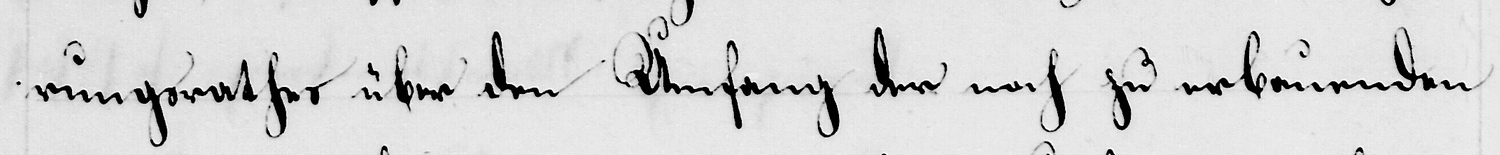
rungsrathes über den Umfang der noch zu erbauenden
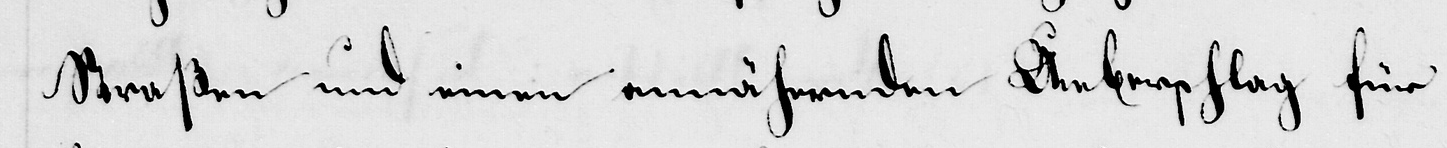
Straßen und einen annähernden Ueberschlag für
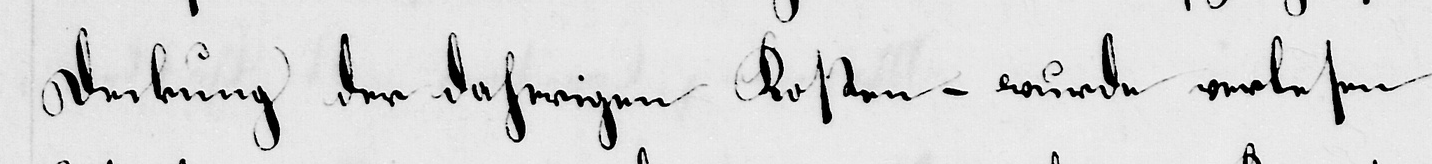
Deckung der daherigen Kosten – wurde verlesen
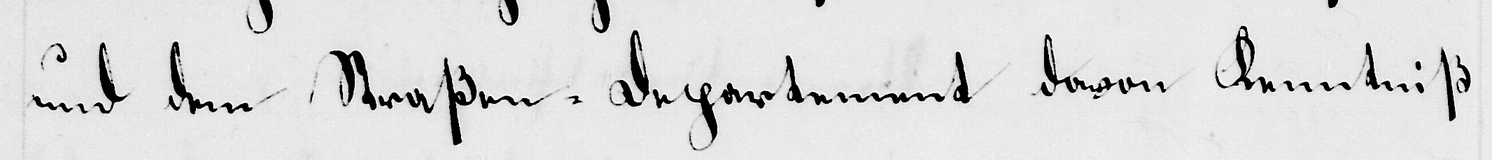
und dem Straßen-Departement davon Kenntniß
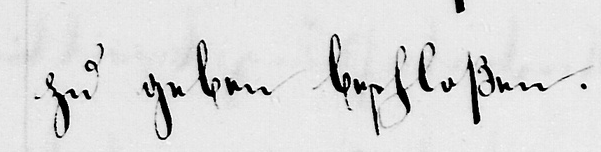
zu geben beschloßen.
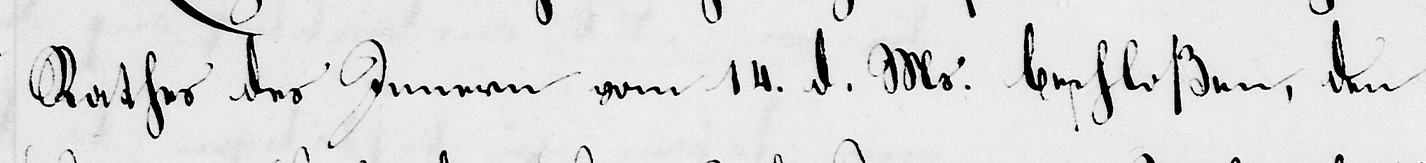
Rathes des Innern vom 14. d. Ms. beschloßen, den
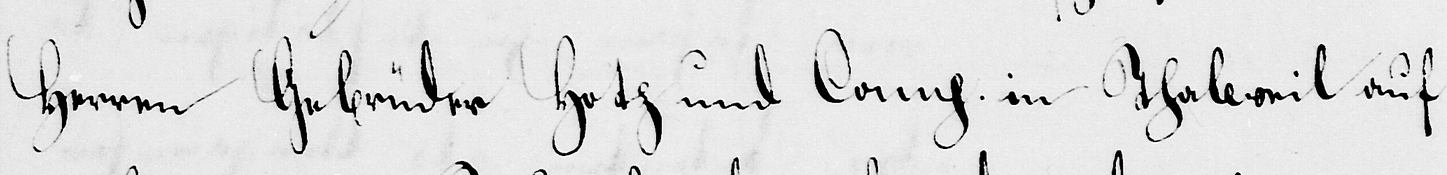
Herren Gebrüder Hotz und Comp in Thalweil auf
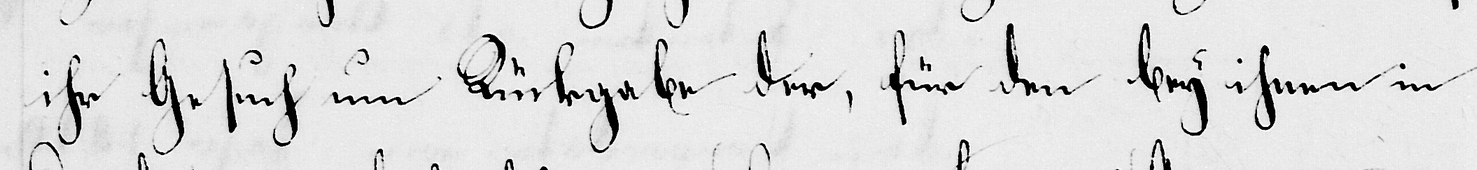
ihr Gesuch um Rückgabe der, für den bey ihnen in
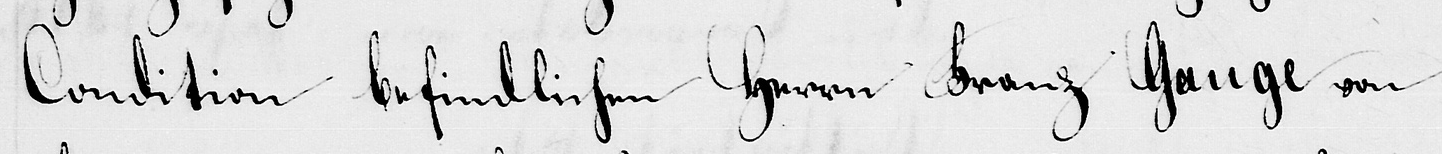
Condition befindlichen Herrn Franz Gauge von
